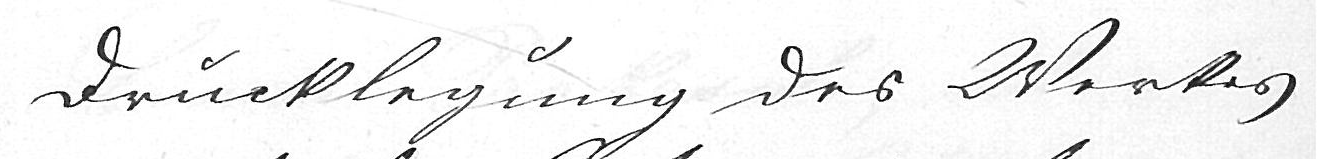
Drucklegung des Werkes
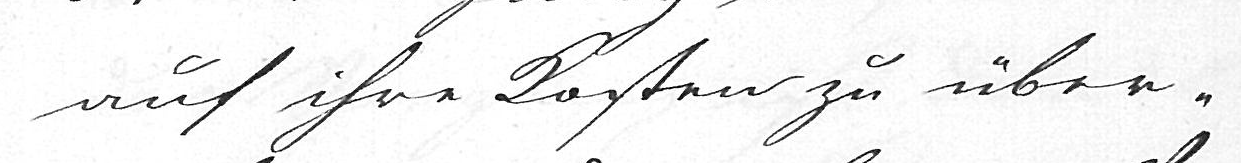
auf ihre Kosten zu über-
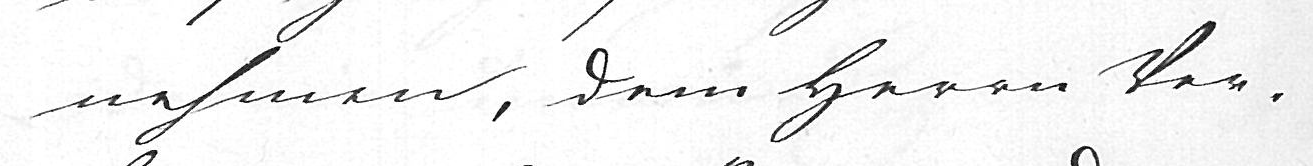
nehmen, dem Herren Ver-
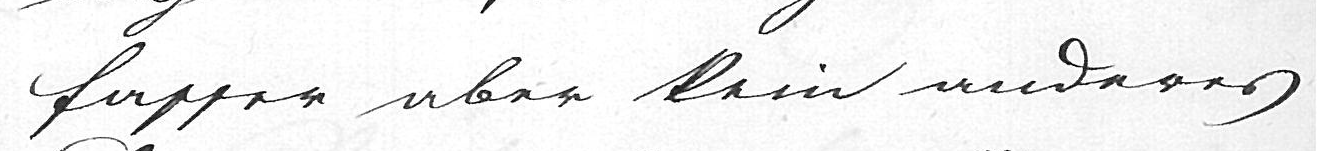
fasser aber kein anderes
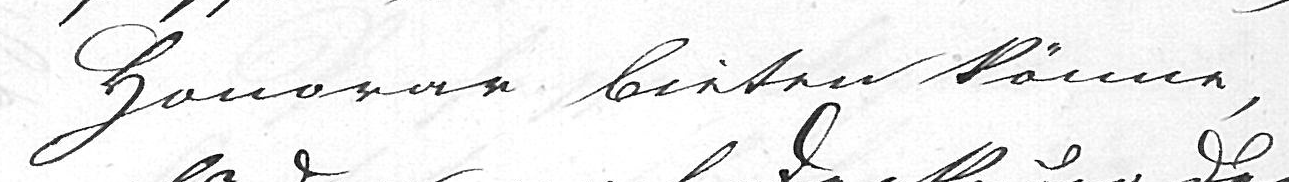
Honorar bieten könne,
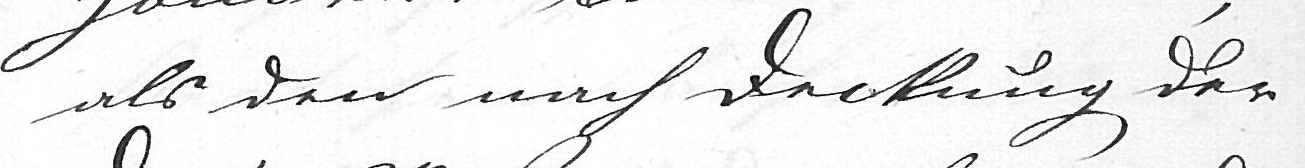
als den nach Deckung der
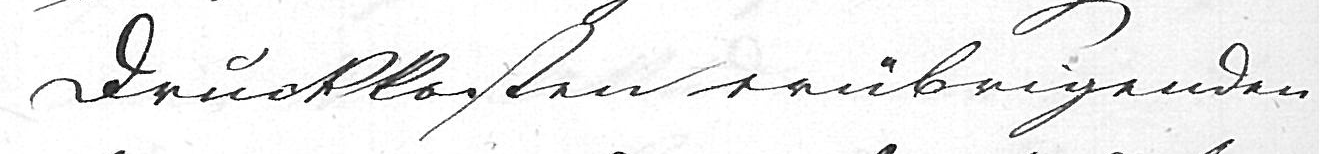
Druckkosten erübrigenden
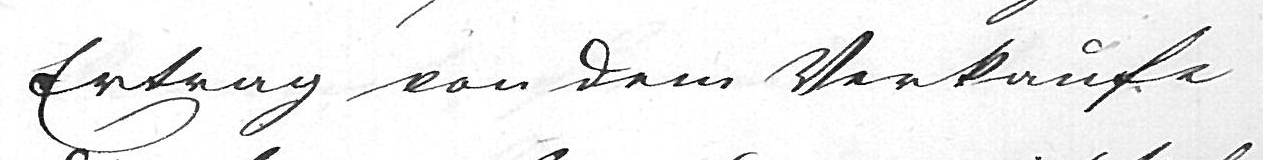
Ertrag von dem Verkaufe
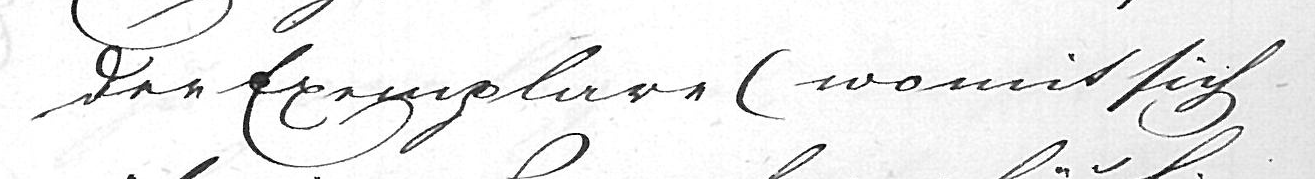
der Exemplare (womit sich
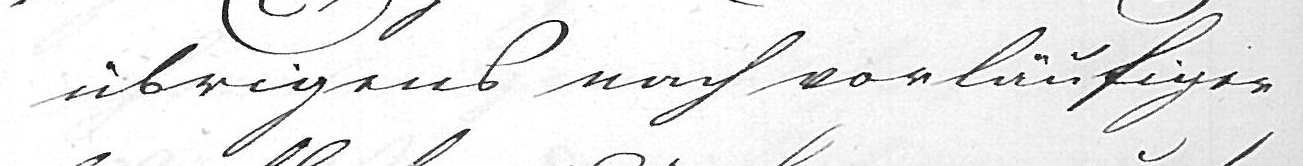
übrigens nach vorläufiger
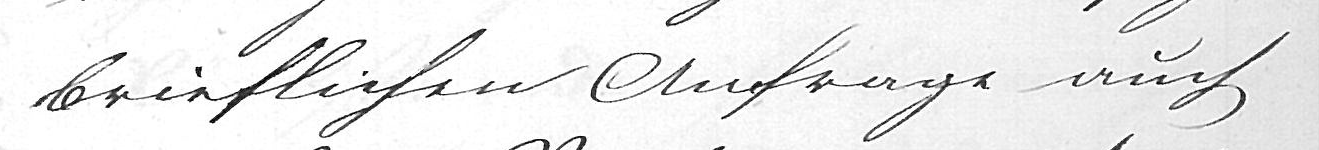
brieflichen Anfrage auch
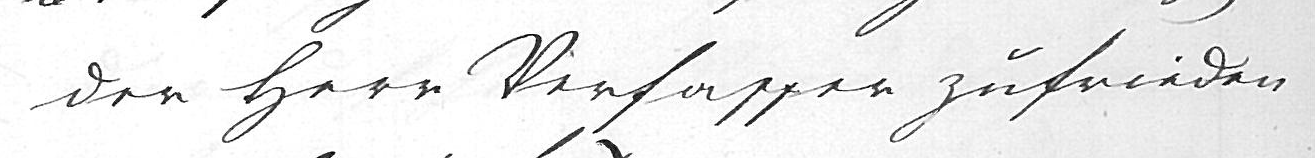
der Herr Verfasser zufrieden
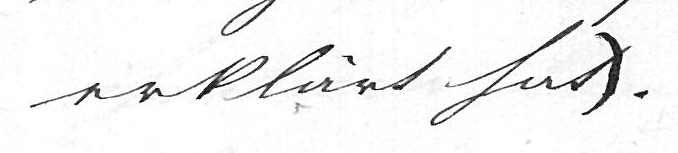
erklärt hat).
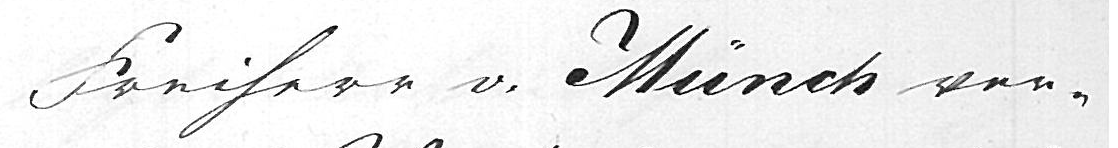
Freiherr v. Münch ver-
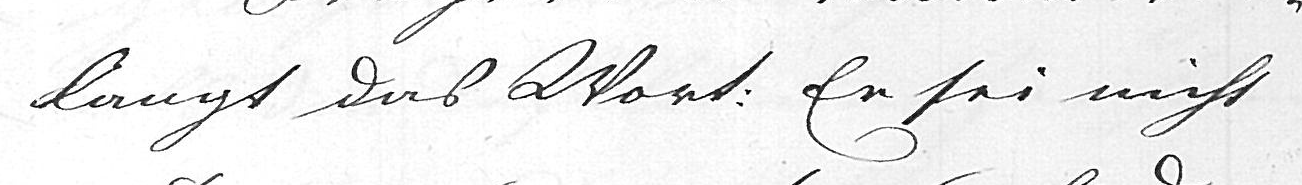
langt das Wort: Er sei nicht
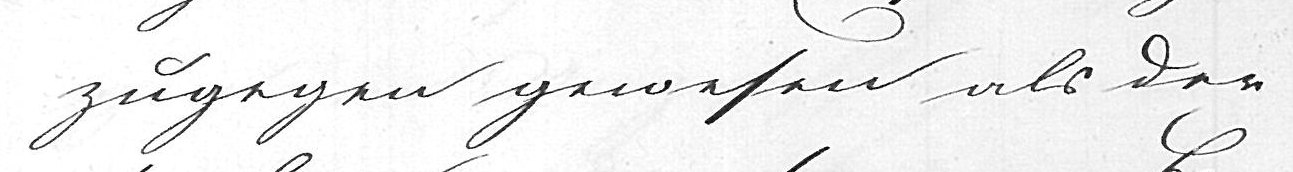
zugegen gewesen als der
